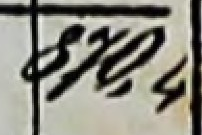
870,4
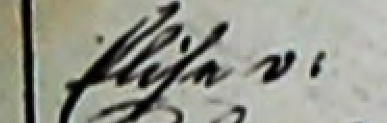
Elise v.
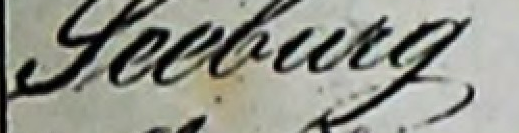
Seeburg
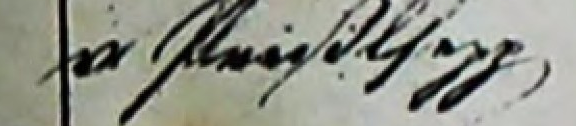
v. Preßlsepp
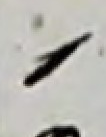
1
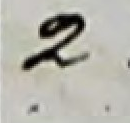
2
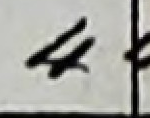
4
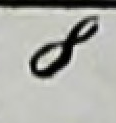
8
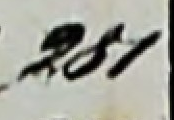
281
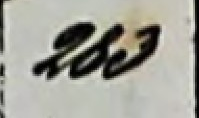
283
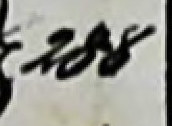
288
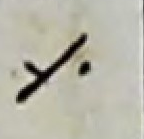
./.
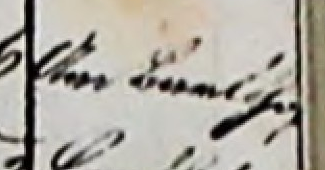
Am Bartth?
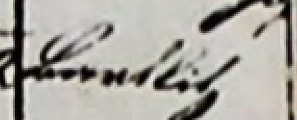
Bartlitz
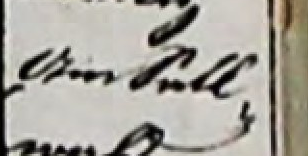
Am Satl„
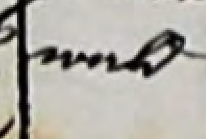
wald
